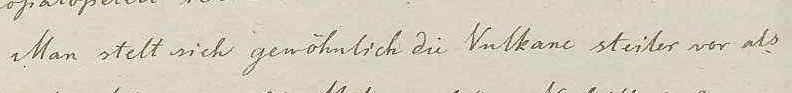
Man stelt sich gewöhnlich die Vulkane steiler vor als
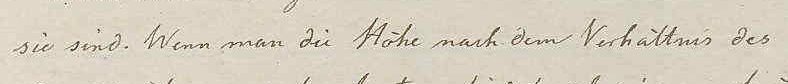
sie sind. Wenn man die Höhe nach dem Verhältnis des
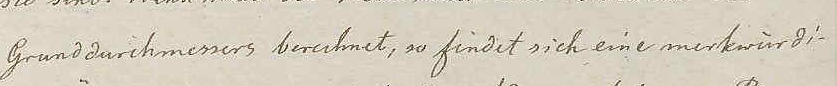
Grunddurchmessers berechnet, so findet sich eine merkwürdi-
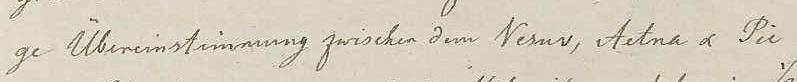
ge Übereinstimmung zwischen dem Vesuv, Aetna & Pic
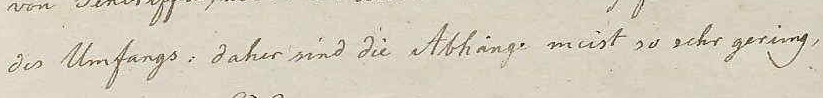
des Umfangs: daher sind die Abhänge meist so sehr gering,
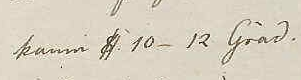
kaum 810–12 Grad.
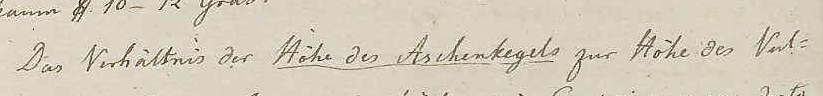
Das Verhältnis der Höhe des Aschenkegels zur Höhe des Vul-
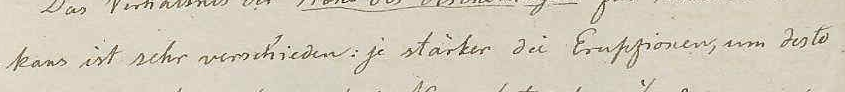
kans ist sehr verschieden: je stärker die Erupzionen, um desto
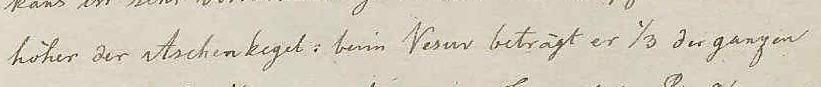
höher der Aschenkegel: beim Vesuv beträgt er ⅓ der ganzen
